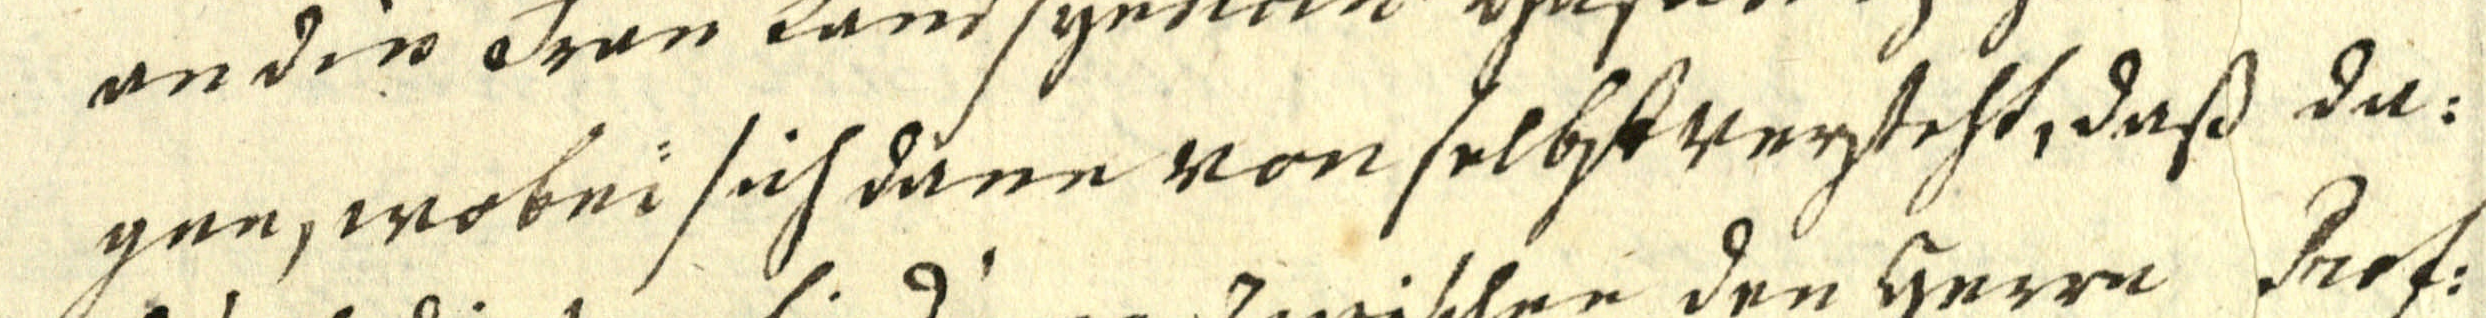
gen, wobei sich dann von selbst versteht, daß da¬
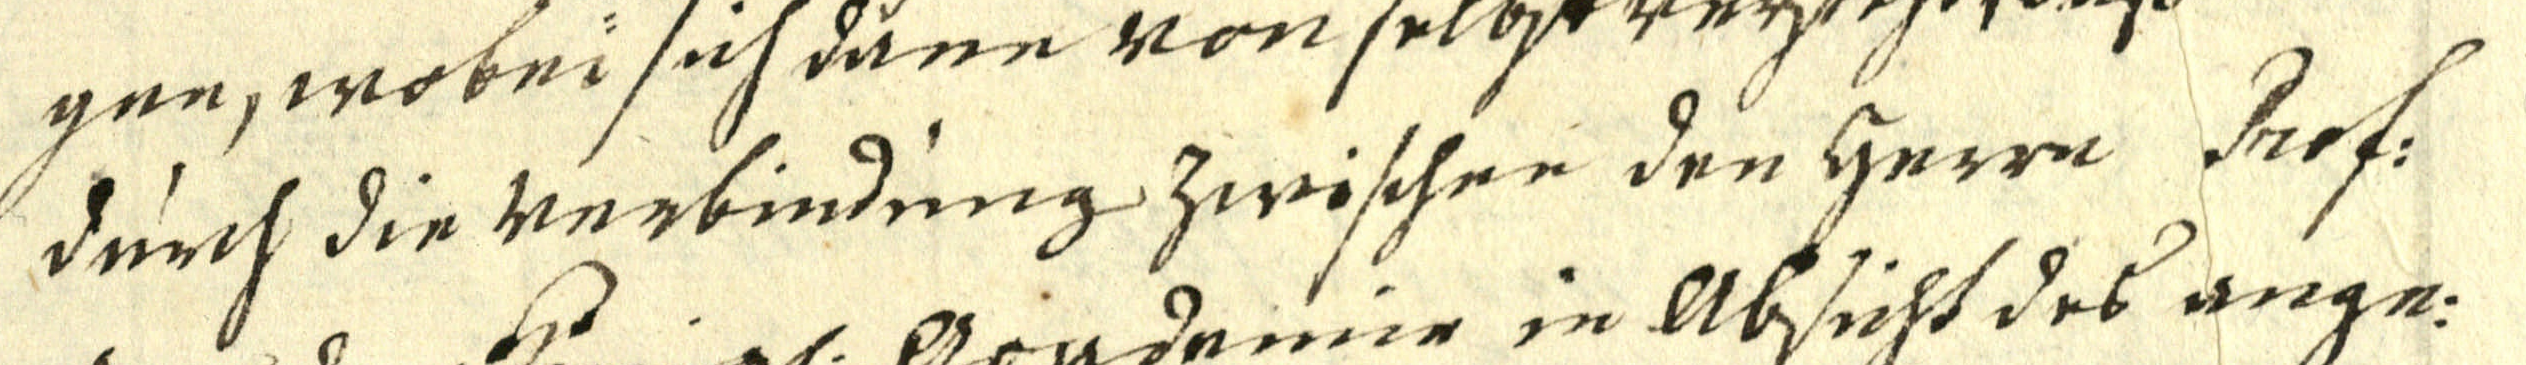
durch die Verbindung zwischen den Herrn Prof.
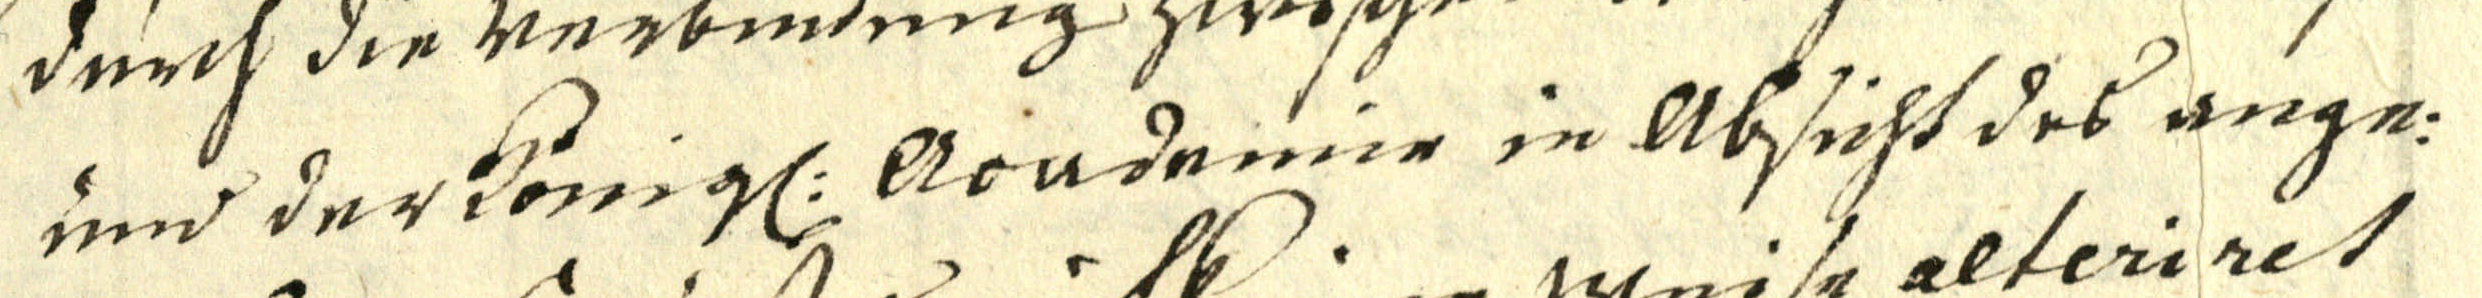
und der Königl. Academie in Absicht des ange¬
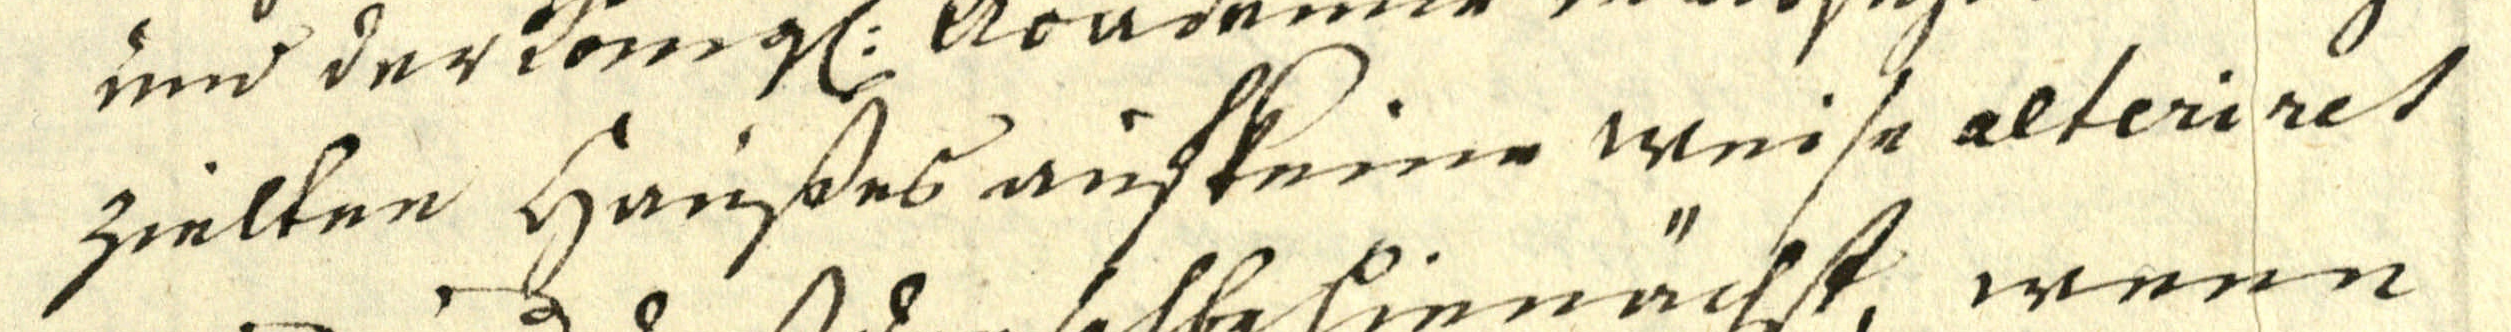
zielten Haußes auf keine Weise alteriret
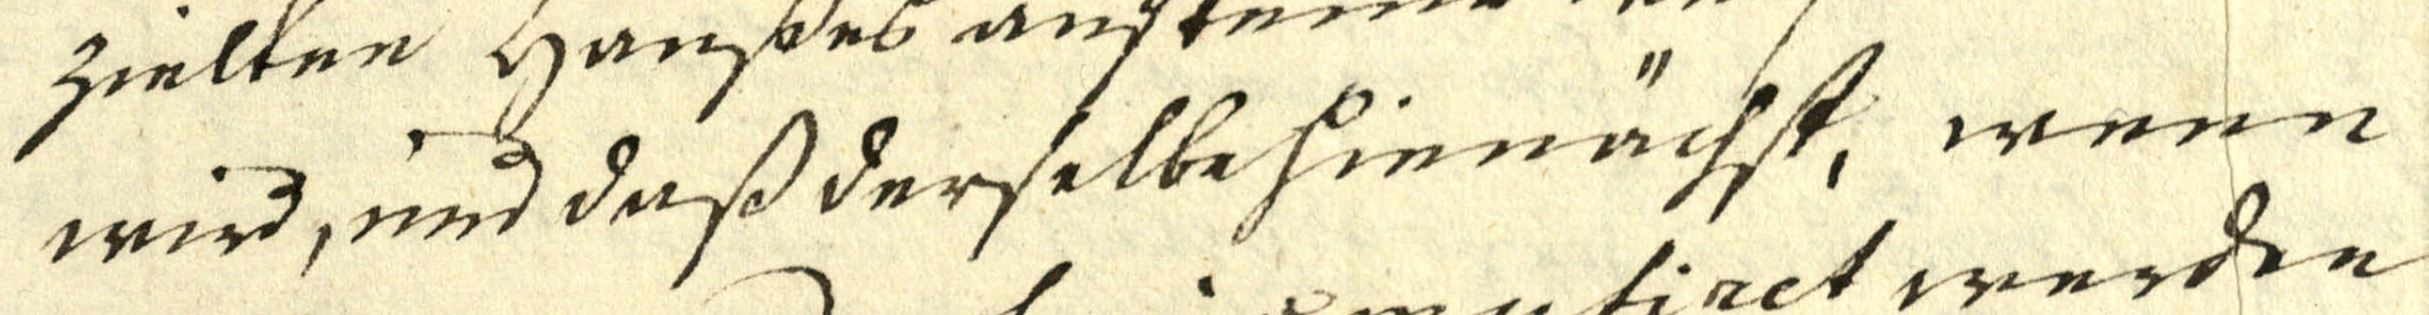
wird, und daß derselbe hienächst, wenn
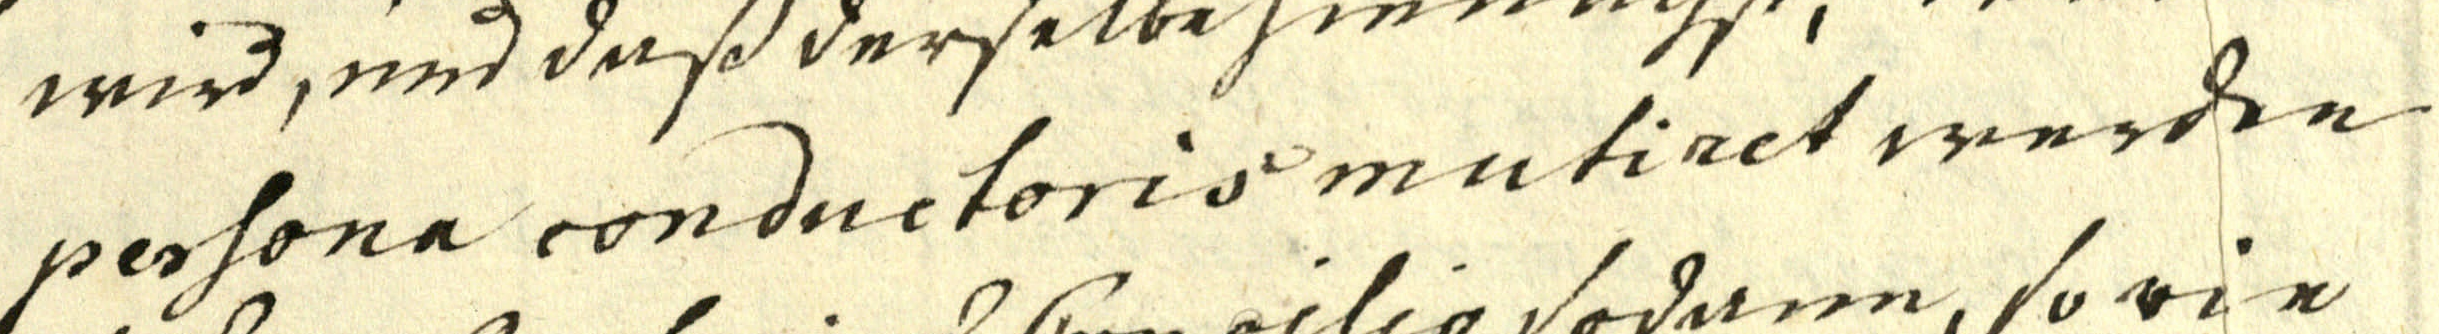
persona condurctoris mutiret werden
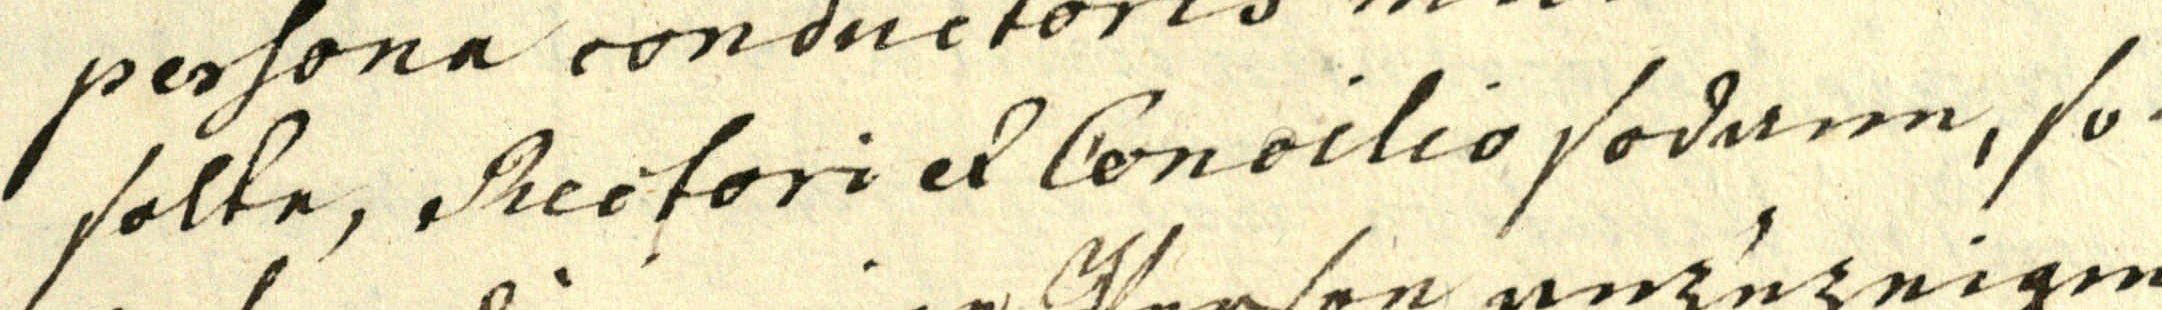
solte, Rectori et Concilio sodann, so wie
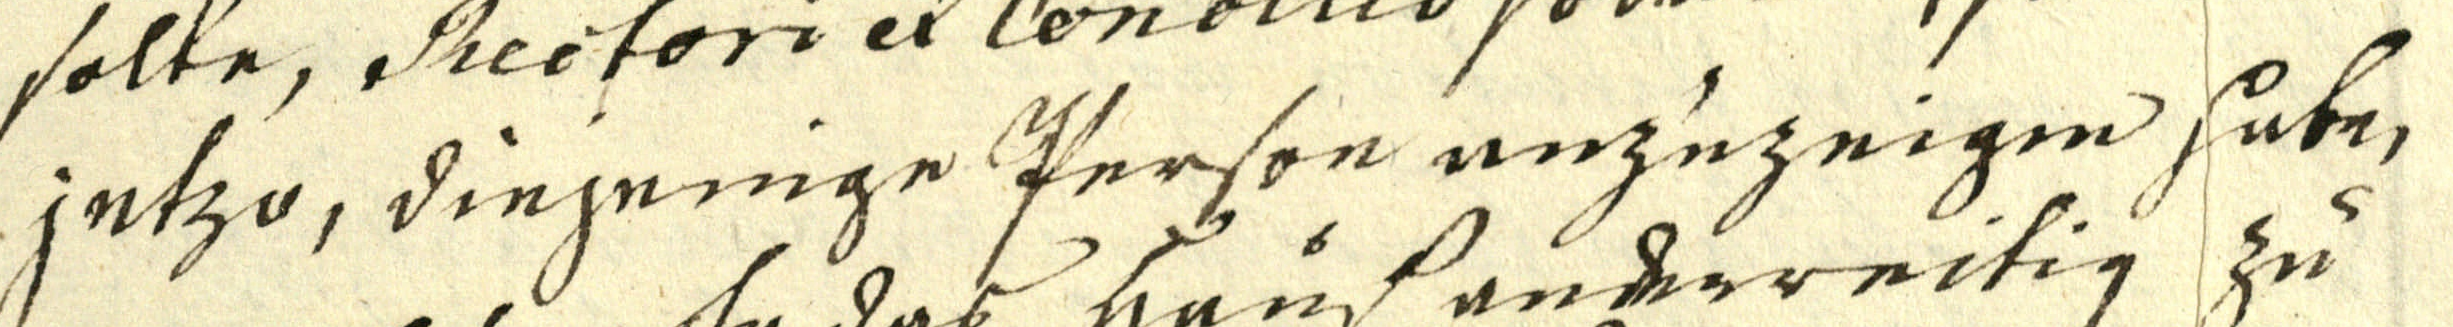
jetzo, diejenige Person anzuzeigen habe,
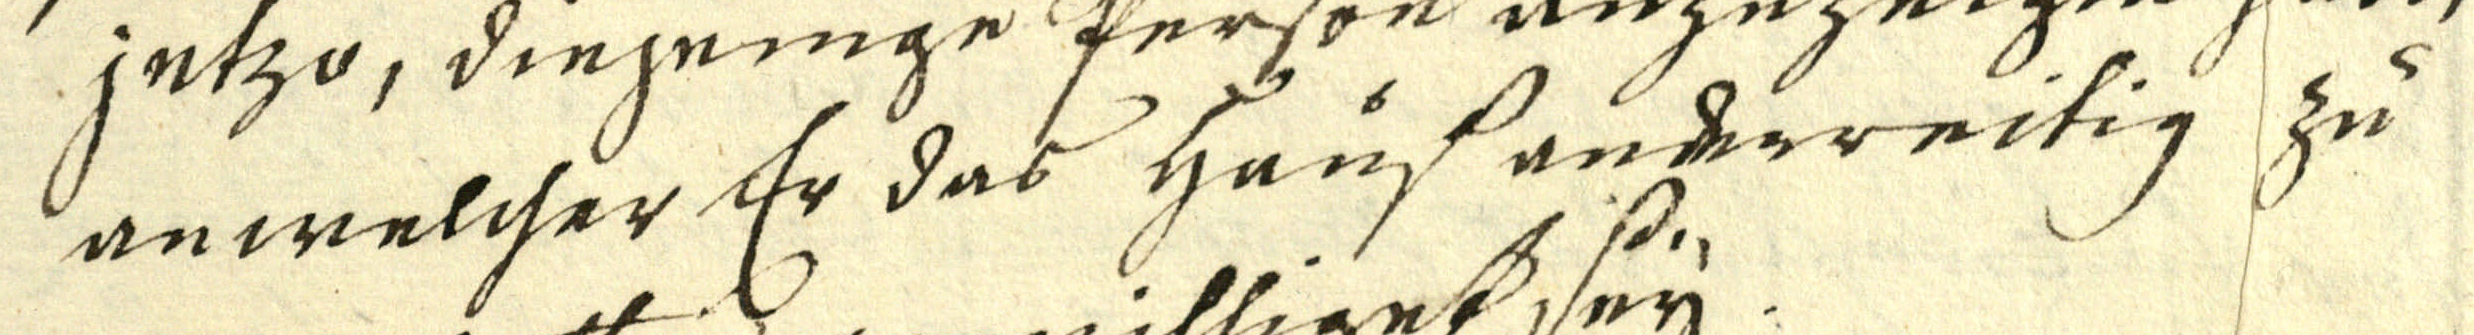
an welcher Er das Haus anderweitig zu
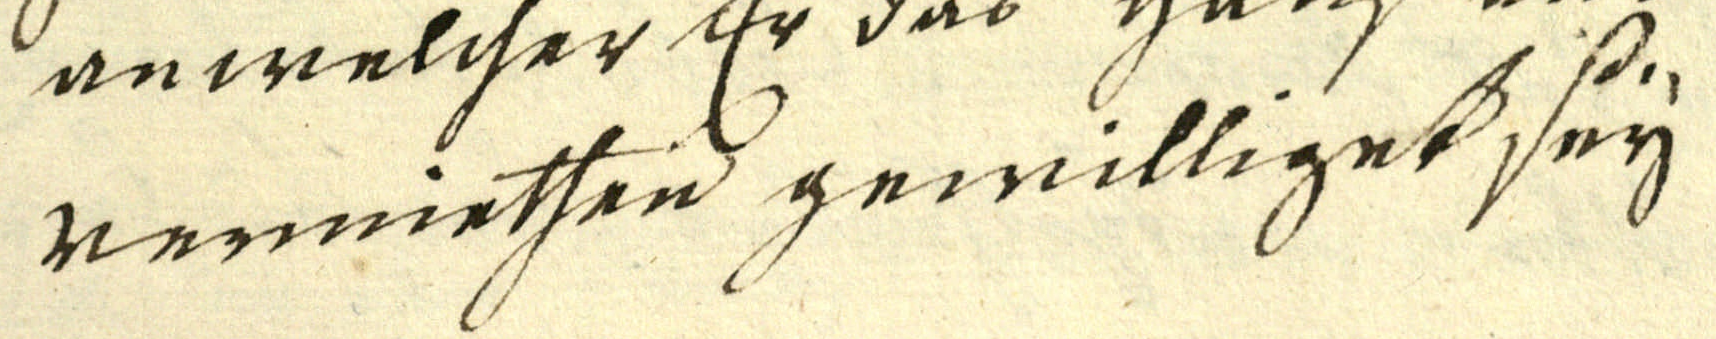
vermiethen gewilliget seÿ.
